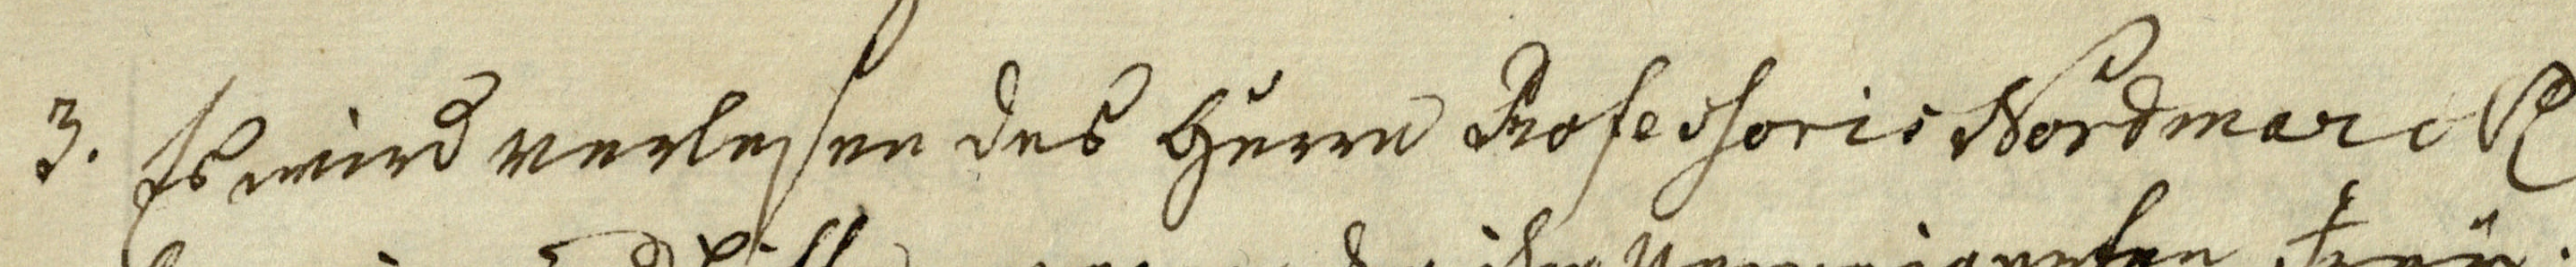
3. Es wird verlesen des Herrn Professoris Nordmarck
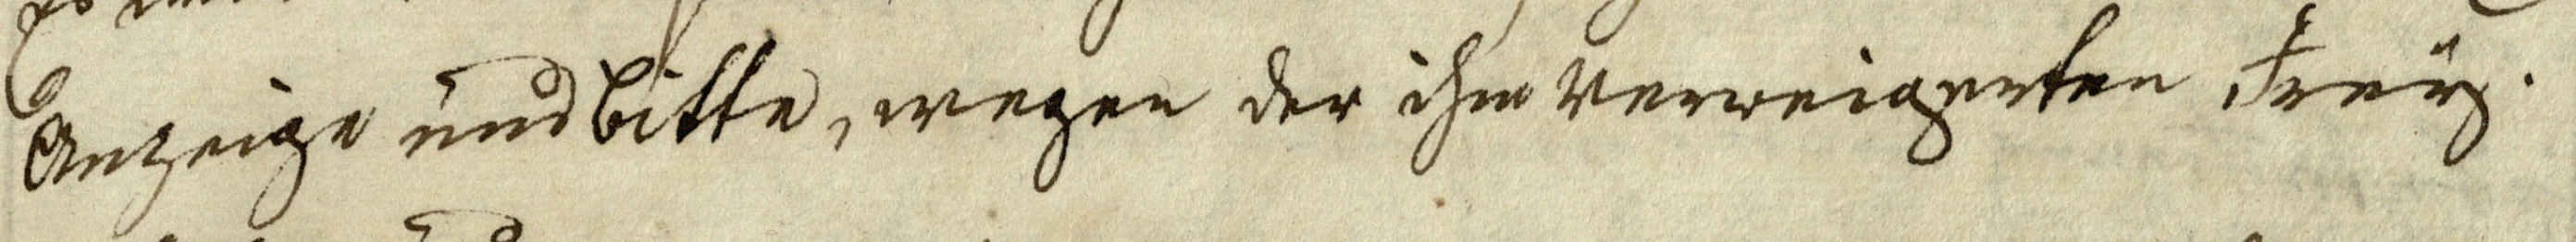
Anzeige und Bitte, wegen der ihm verweigerten Freÿ¬
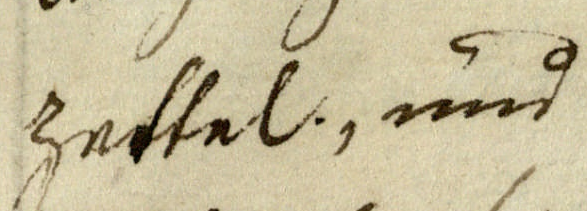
zettel, und
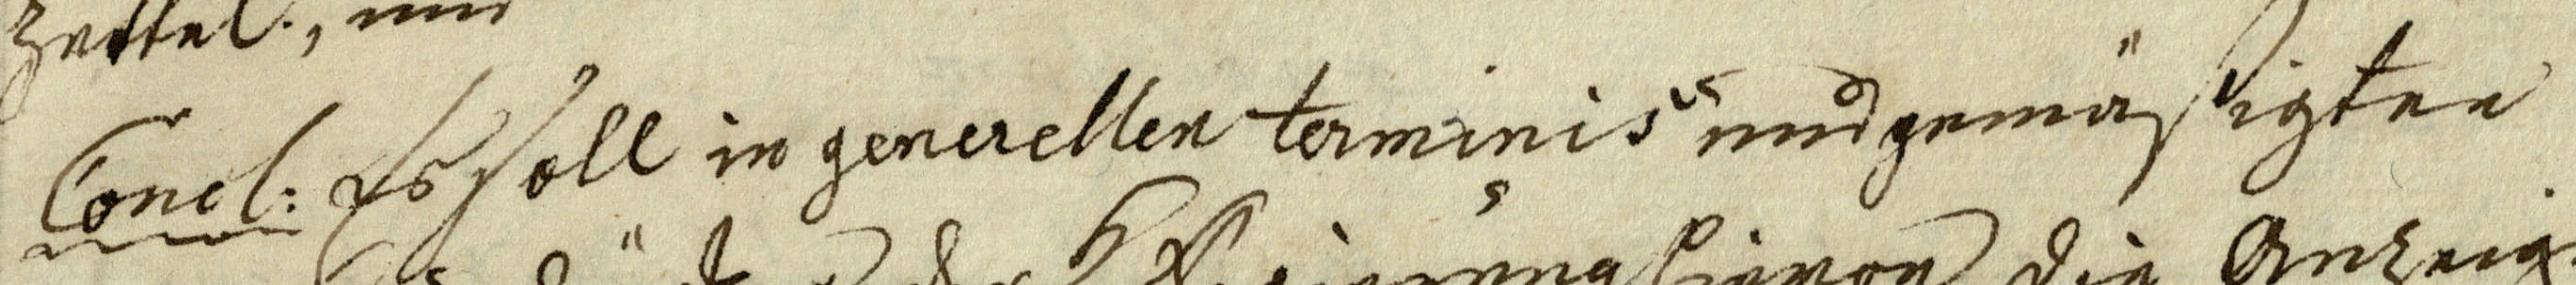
Concl. Es soll in generellen terminis und gemäßigten
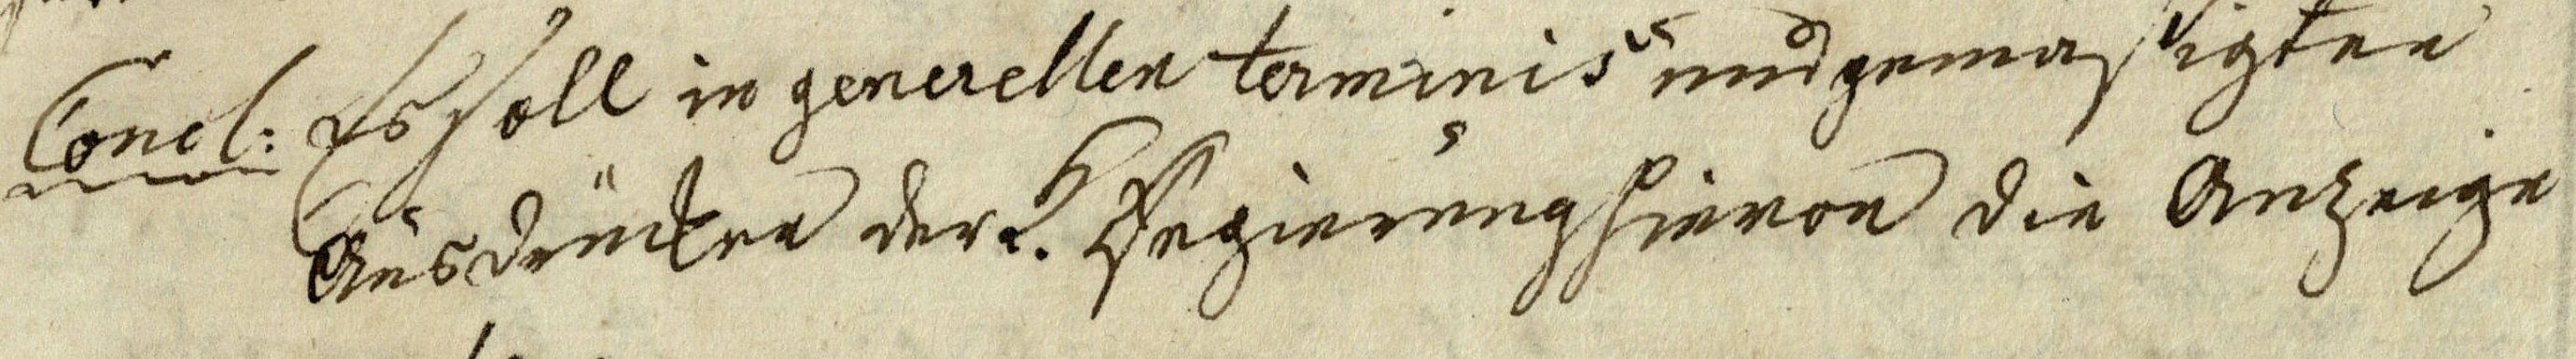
Ausdrücken der K. Regierung hievon die Anzeige
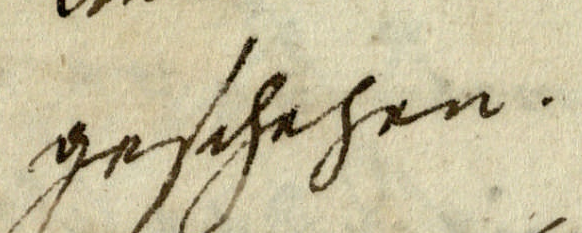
geschehen.
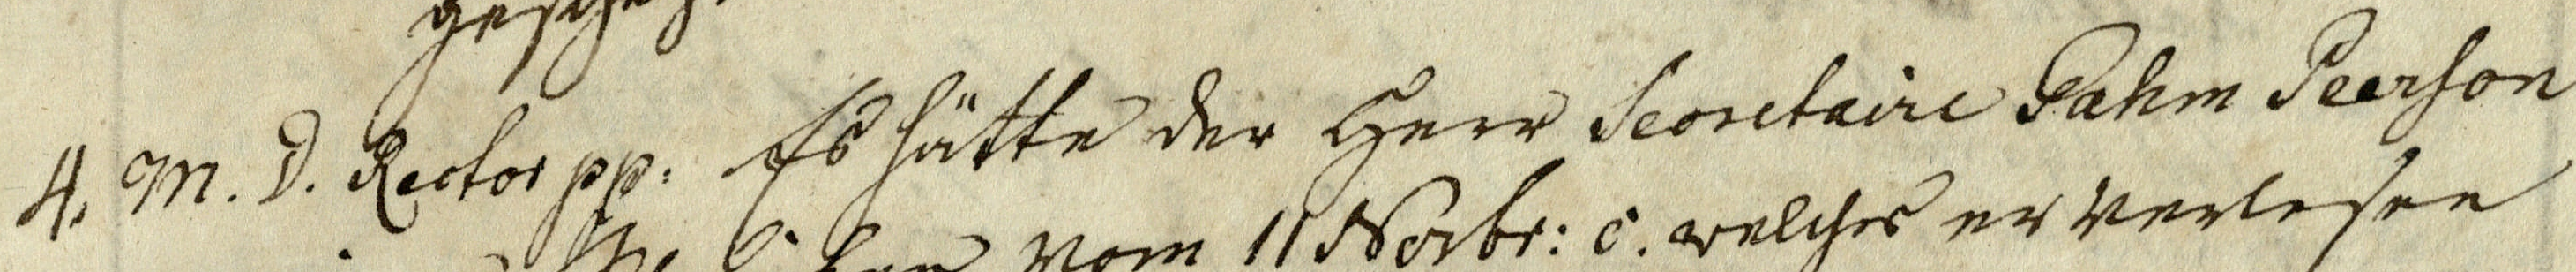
4. M. D. Rector pp. Es hätte der Herr Secretaire Gahm Peerson
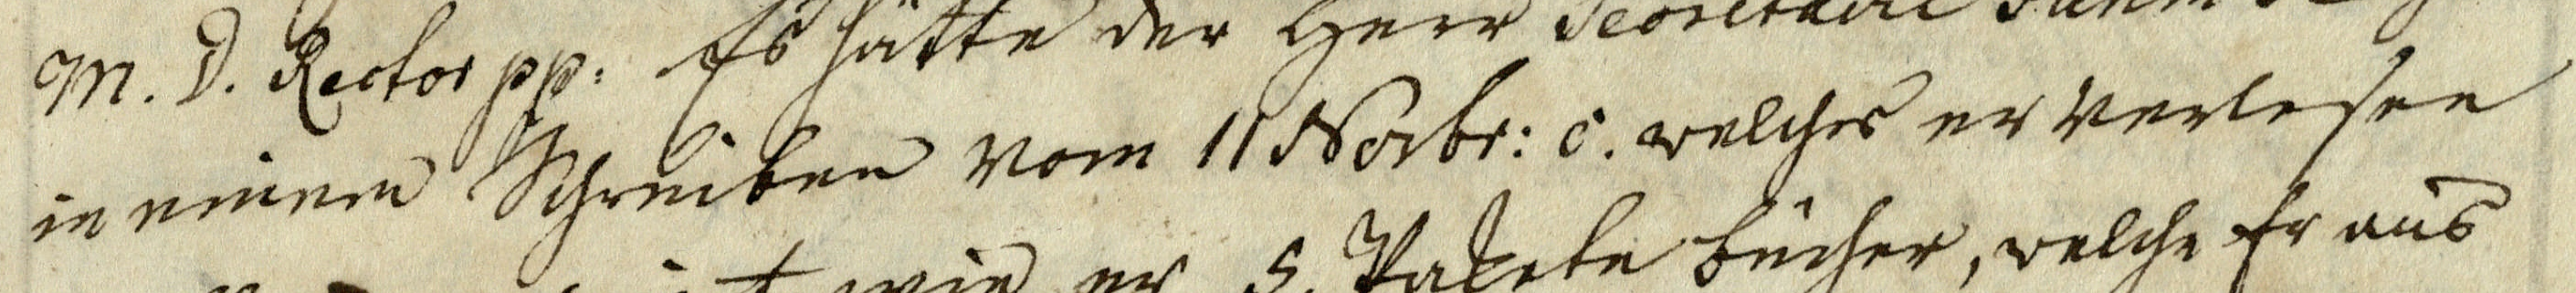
in einem Schreiben vom 11. Novbr. c. welches er verlesen
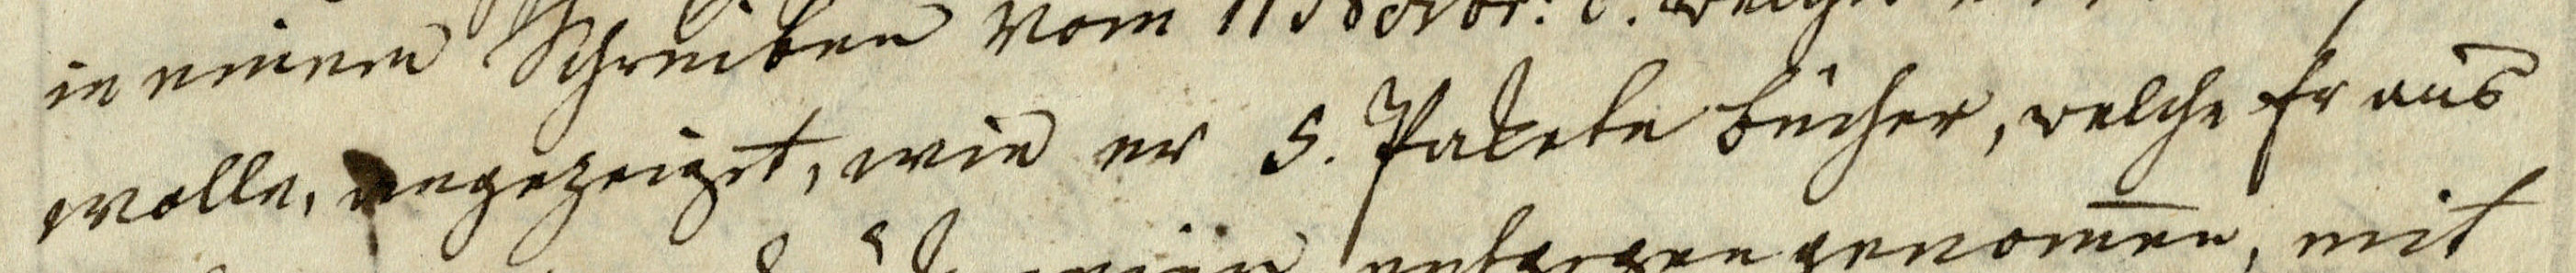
wolle, angezeiget, wie er 5. Pakete Bücher, welche Er aus
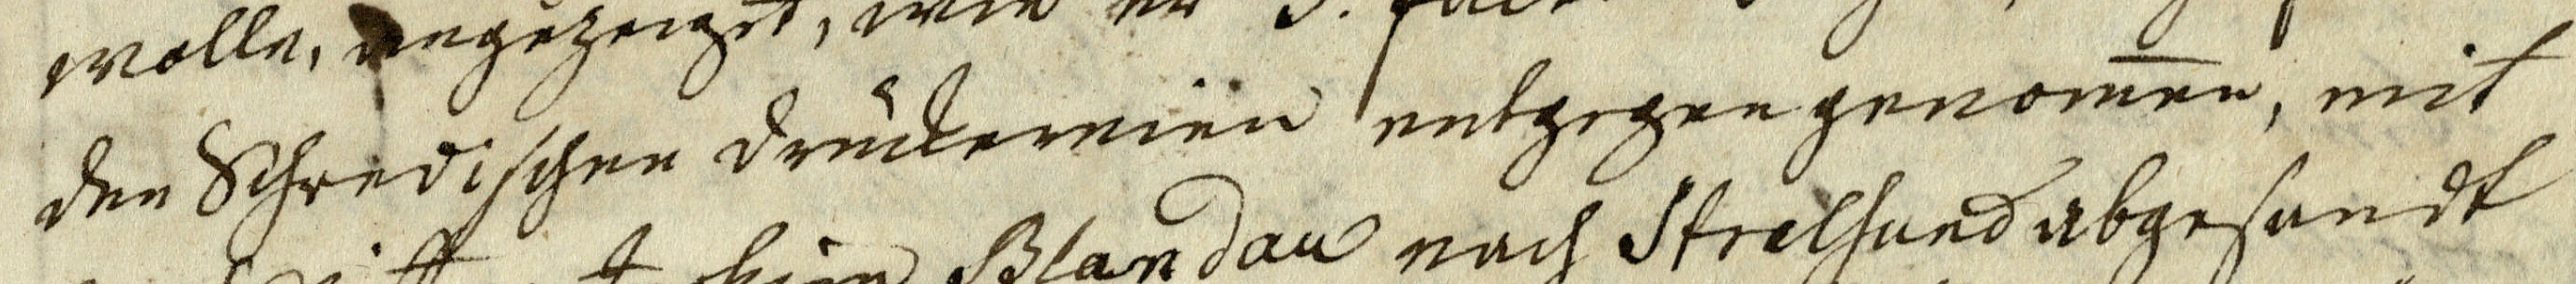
den Schwedischen Druckereien entgegengenomen, mit
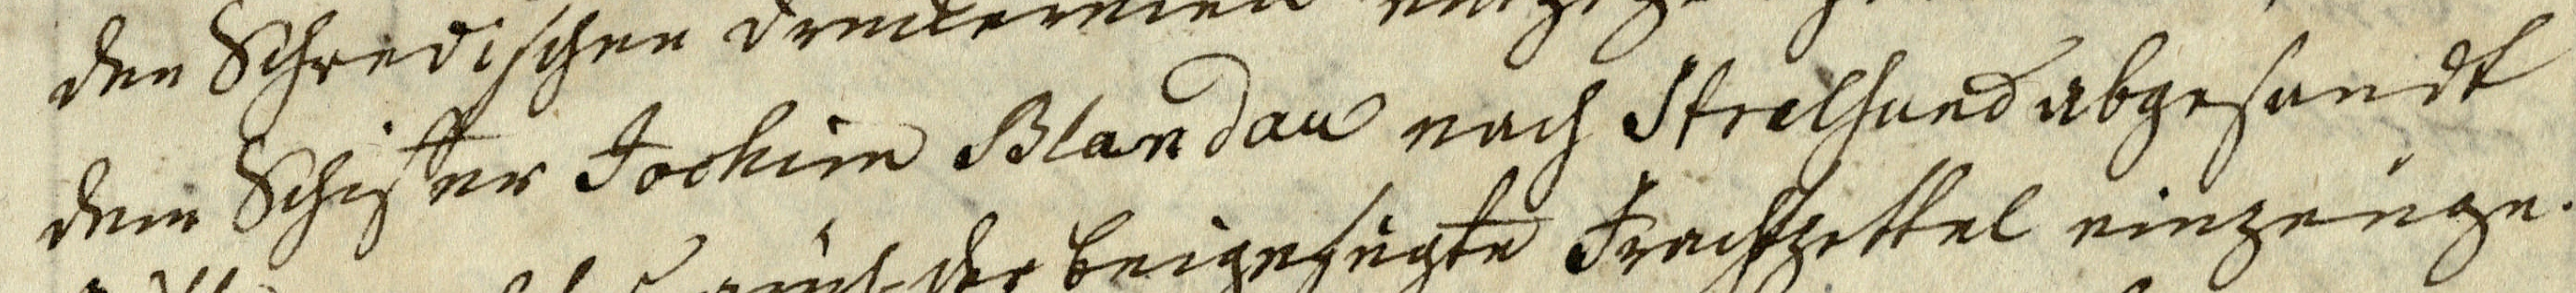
dem Schiffer Joachim Blandau nach Stralsund abgesandt
